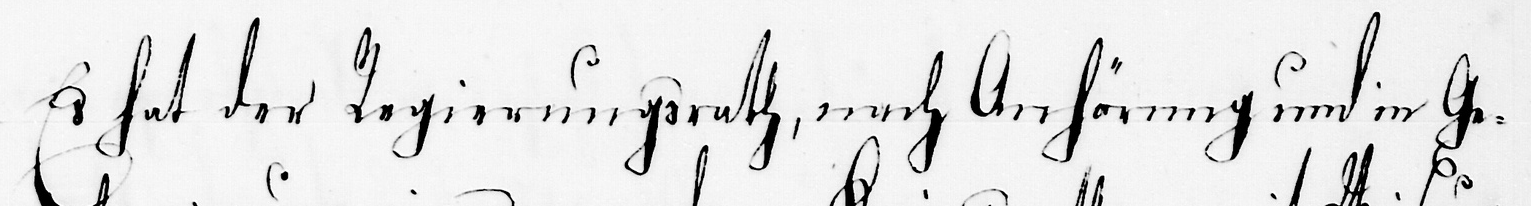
Es hat der Regierungsrath, nach Anhörung und in Ge¬
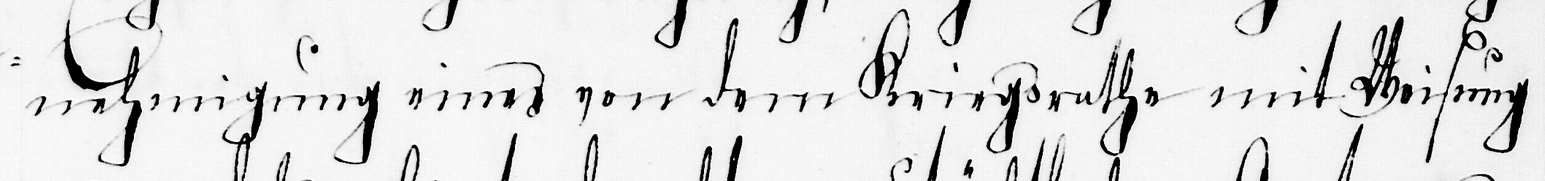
nehmigung eines von dem Kriegsrathe mit Weisung
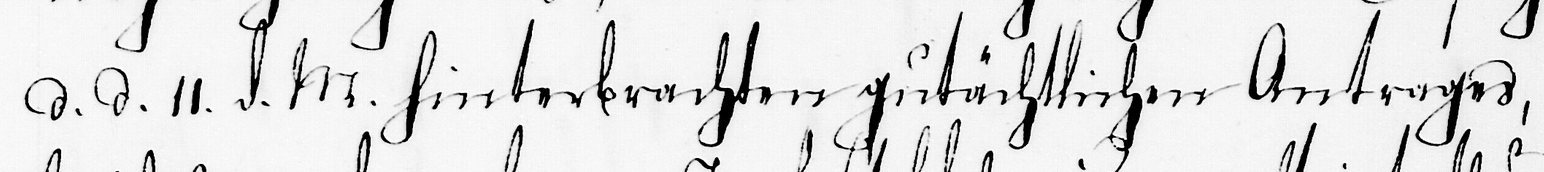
d. d. 11. d. M. hinterbrachten gutächtlichen Antrages,
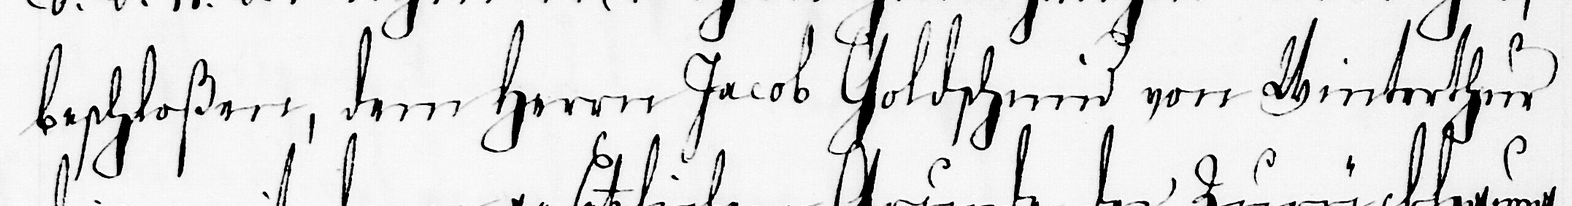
beschloßen, dem Herrn Jacob Goldschmid von Winterthur
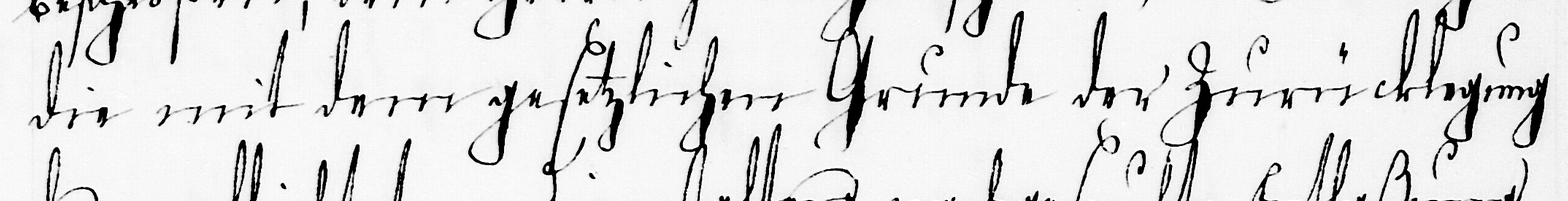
die mit dem gesetzlichen Grunde der Zurücklegung
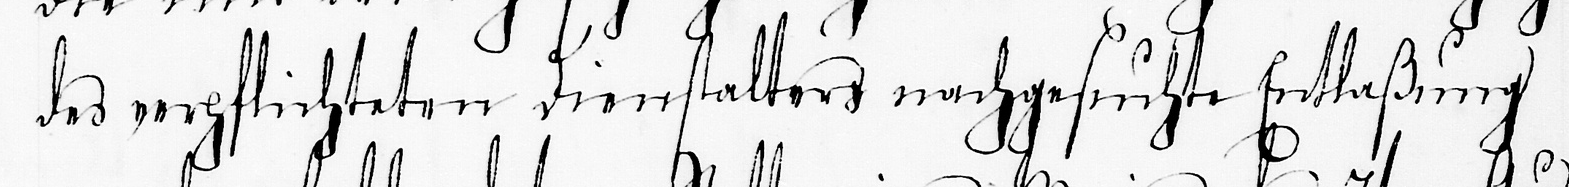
des verpflichteten Dienstalters nachgesuchte Entlaßung
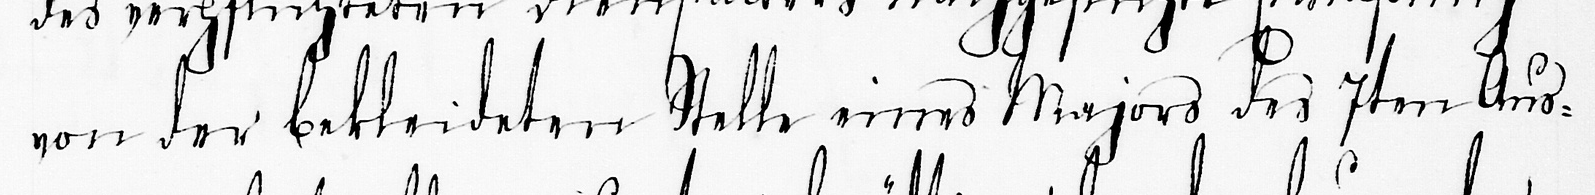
von der bekleideten Stelle eines Majors des 7ten Aus¬
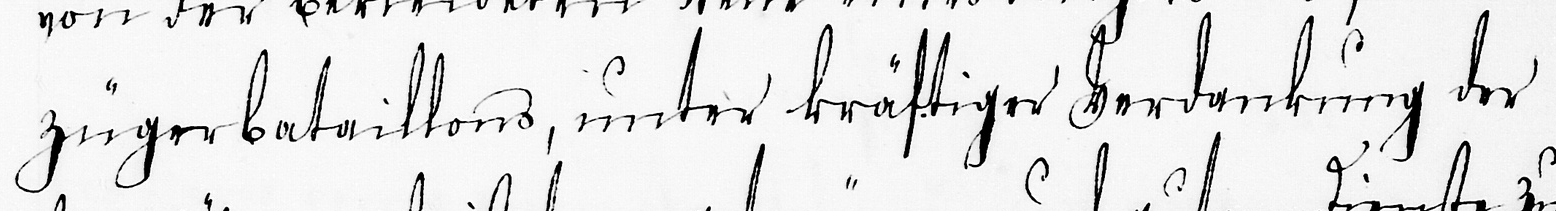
zügerbataillons, unter kräftiger Verdankung der
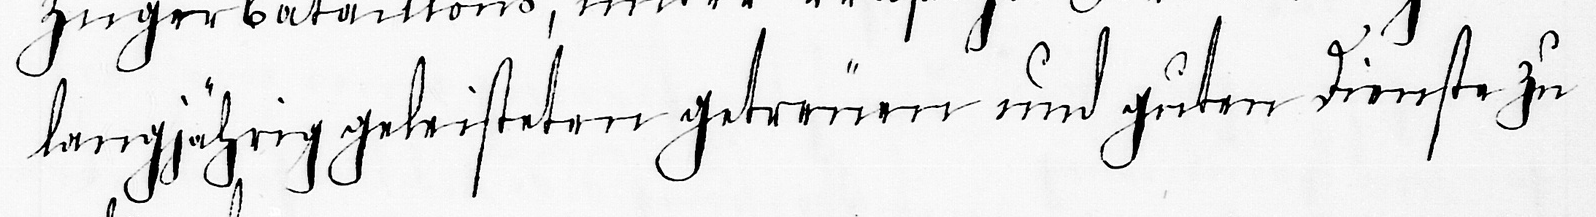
langjährig geleisteten getreuen und guten Dienste zu
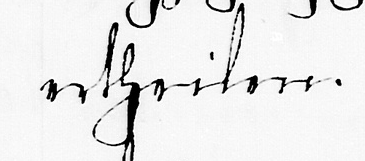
ertheilen.
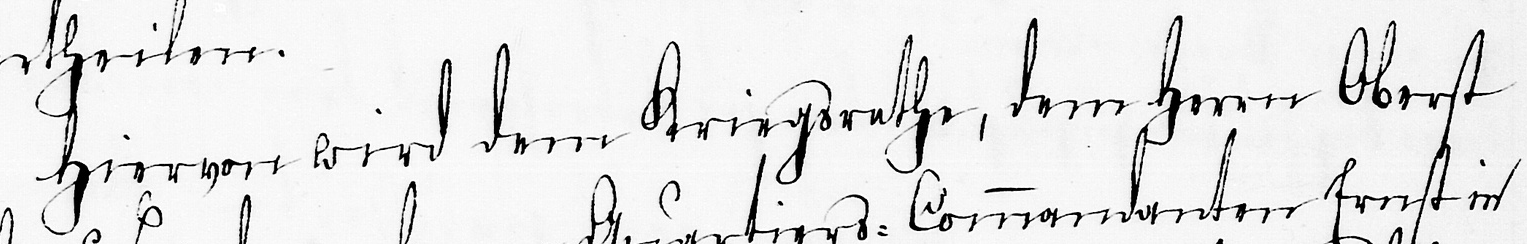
Hiervon wird dem Kriegsrathe, dem Herrn Oberst
